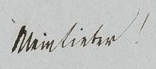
Mein Lieber!
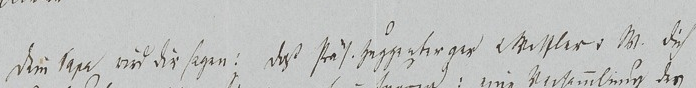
Dein Papa wird dir sagen: daß Präs. Huggenberger & Weffler v. W. dich
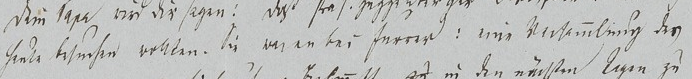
heute besuchen wollten. Sie waren bei Furrer: eine Versammlung des
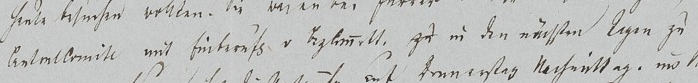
CentralComite mit Einberufg. v Bez Cmmdtzu in den nächsten Tagen zu
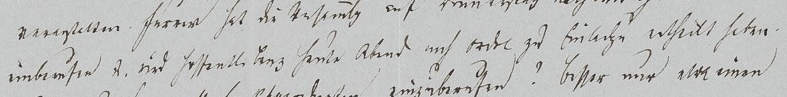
einberufen u. wird hoffentlich Benzheute Abend noch ordre zu Einladgn ertheilt haben.
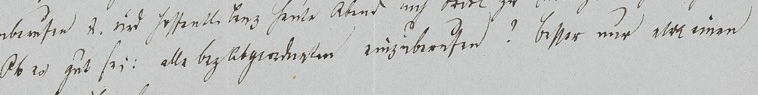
Ob es gut sei: alle BezAbgeordneten einzuberufen? Besser nur etwa einen
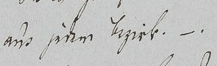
aus jedem Bezirk. –.
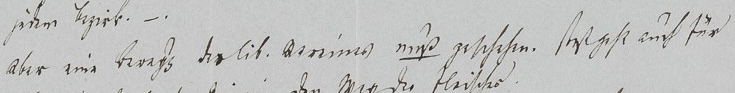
Aber eine Bewegg. des liberalen Vereines muß geschehen. Sonst geht auch für
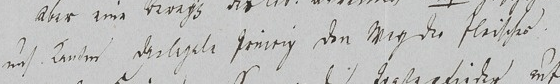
uns. Kanton das legale Princip den Weg des Fleisches.
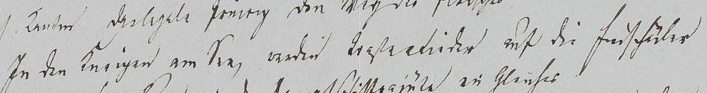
In den Kneipen am See werden Toaste & Lieder auf die Freischärler
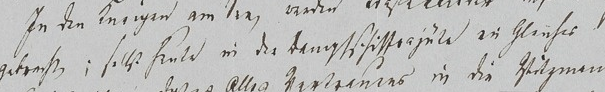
gebracht; selbst heute in der Dampfschiffcajüte ein Gleiches.
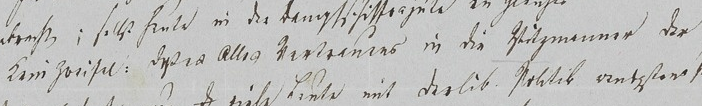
Kein Zweifel: daß es Alles Vertrauens in die Stützmänner der
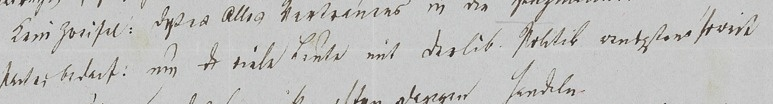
Partei bedarf: um viele Leute mit der lib. Politik wenigstens soweit
